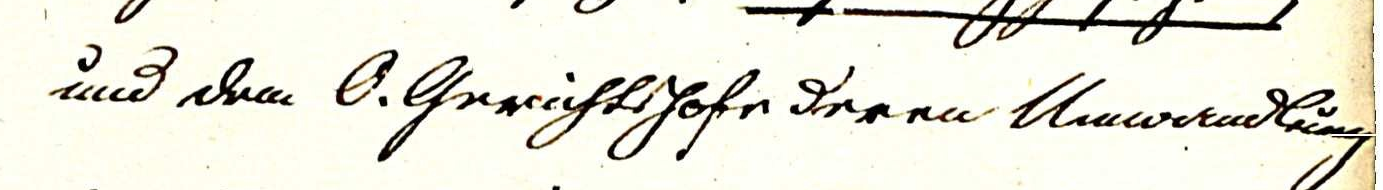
und dem O. Gerichtshofe deren Umwandlung
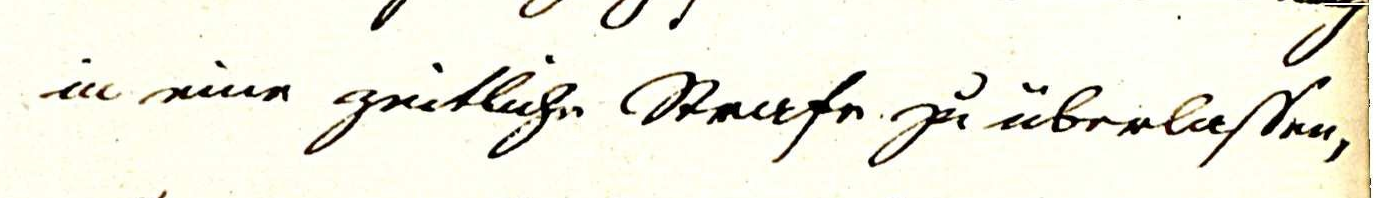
in eine zeitliche Strafe zu überlaßen,
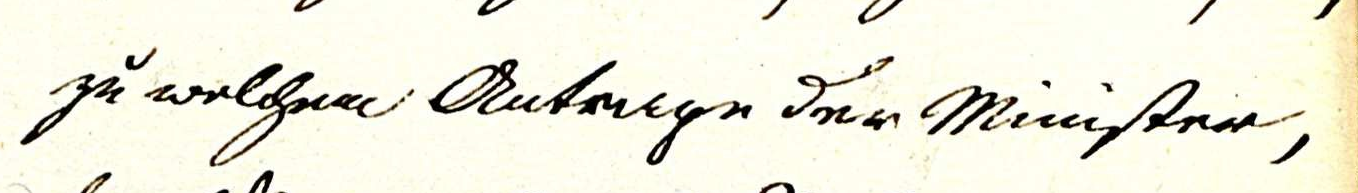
zu welchem Antrage der Minister,
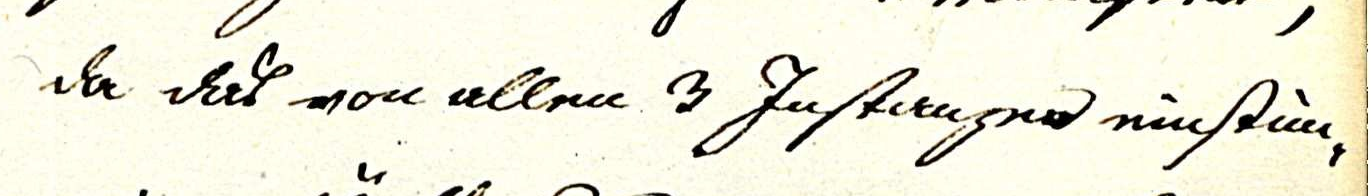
da das von allem 3 Instanzen einstim¬
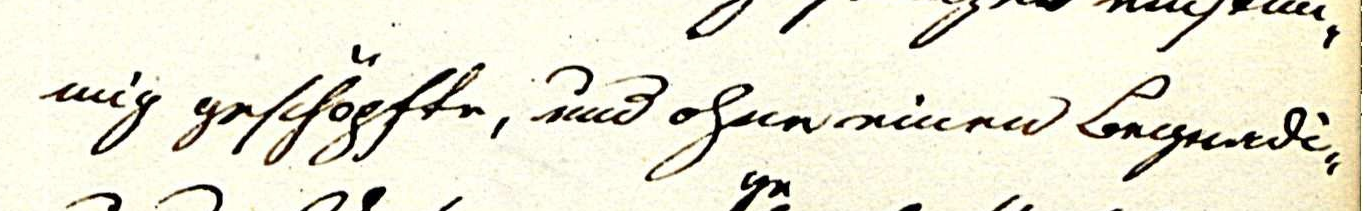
mig geschöpfte, und ohne einen Begnadi¬
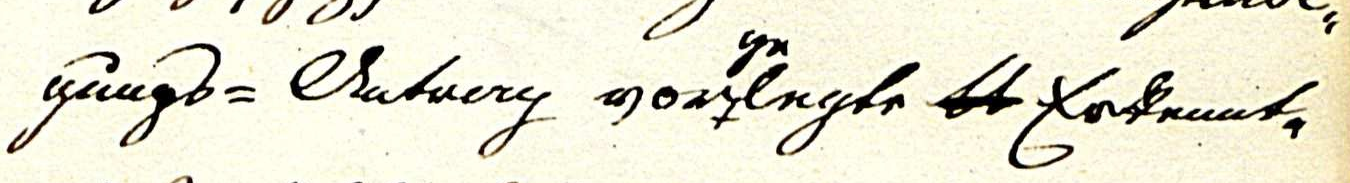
gungs-Antrag vorgelegte Erkennt¬
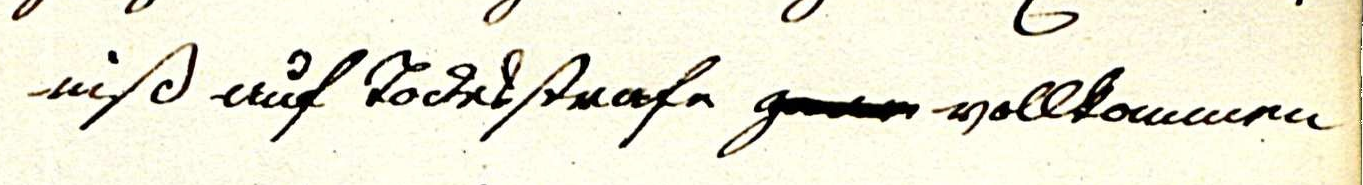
niß auf Todesstrafe vollkommen
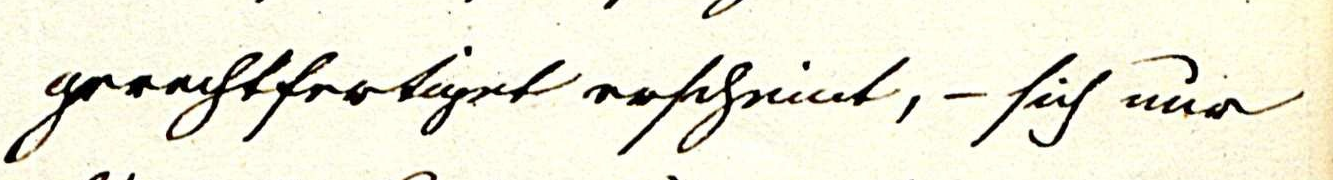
gerechtfertigt erscheint, -- sich nur
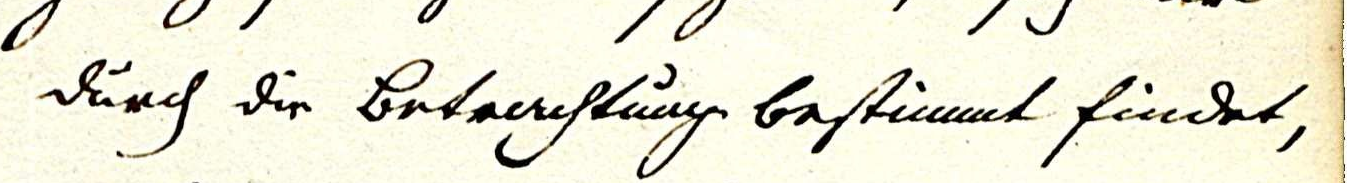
durch die Betrachtung bestimmt findet,
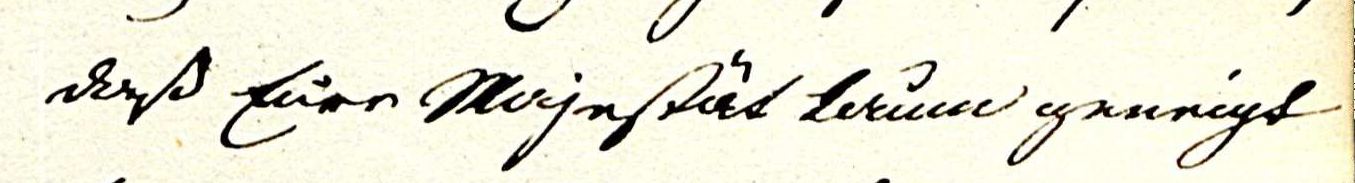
daß Eure Majestät kaum geneigt
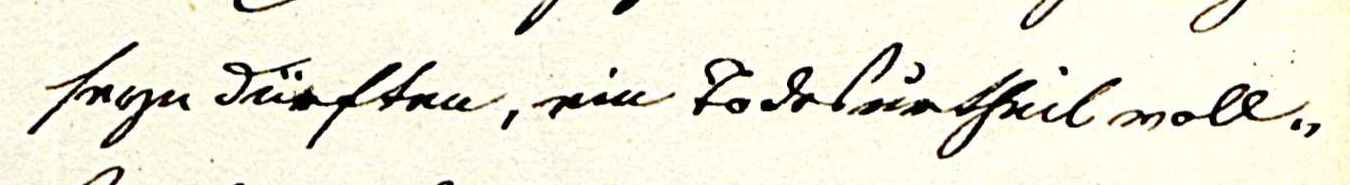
seyn dürften, ein Todesurtheil voll¬
